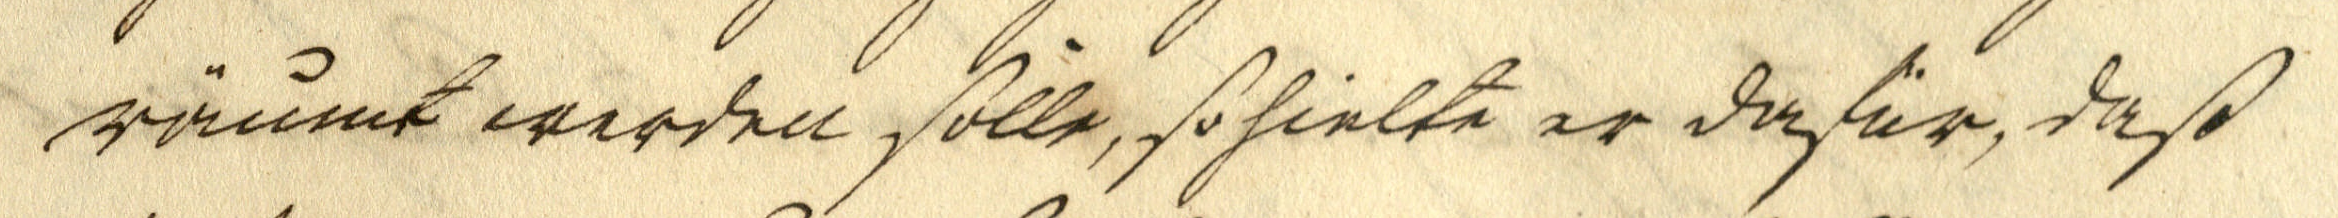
raumt werden solle, so hielte er dafür, daß
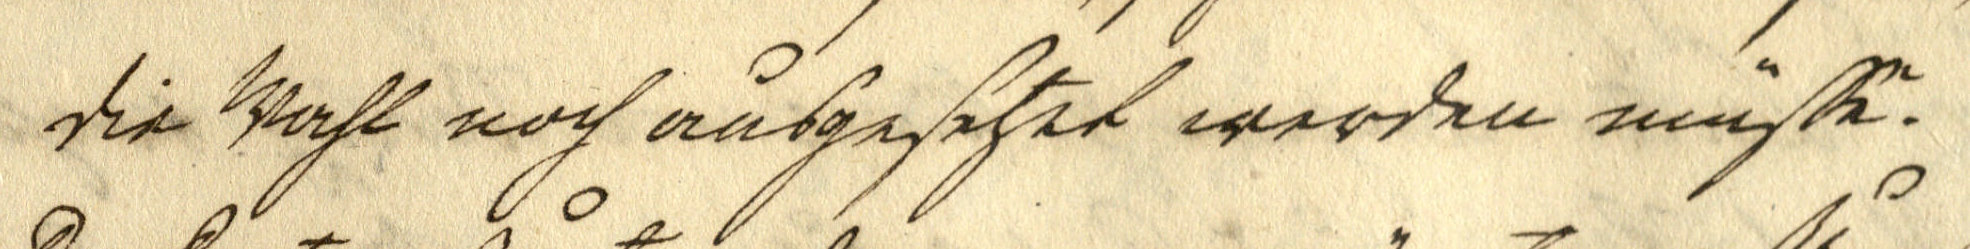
die Wahl noch ausgesetzt werden müsse.
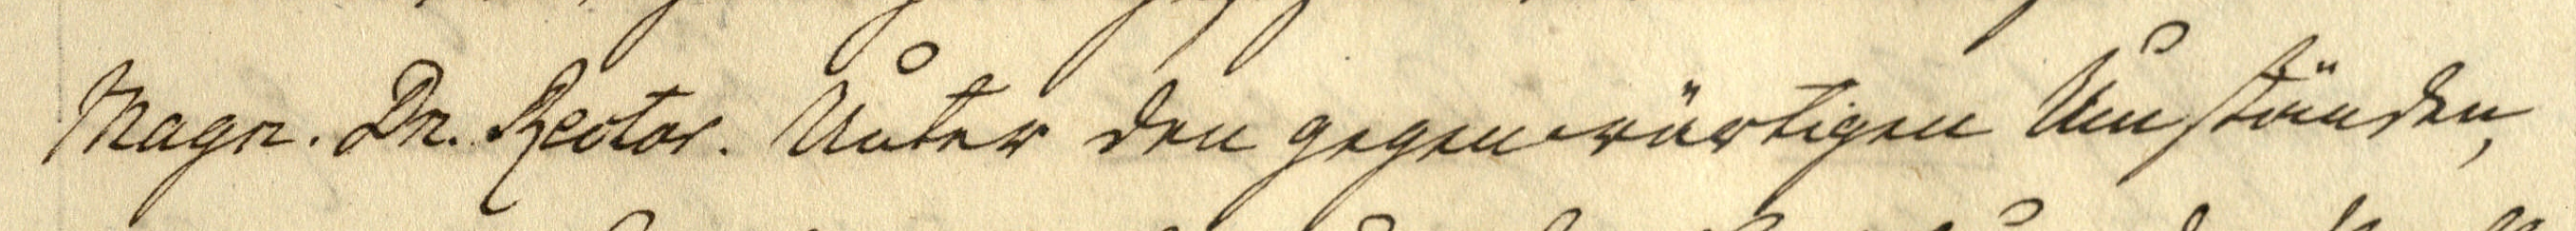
Magn. Dn. Rector. Unter den gegenwärtigen Umständen
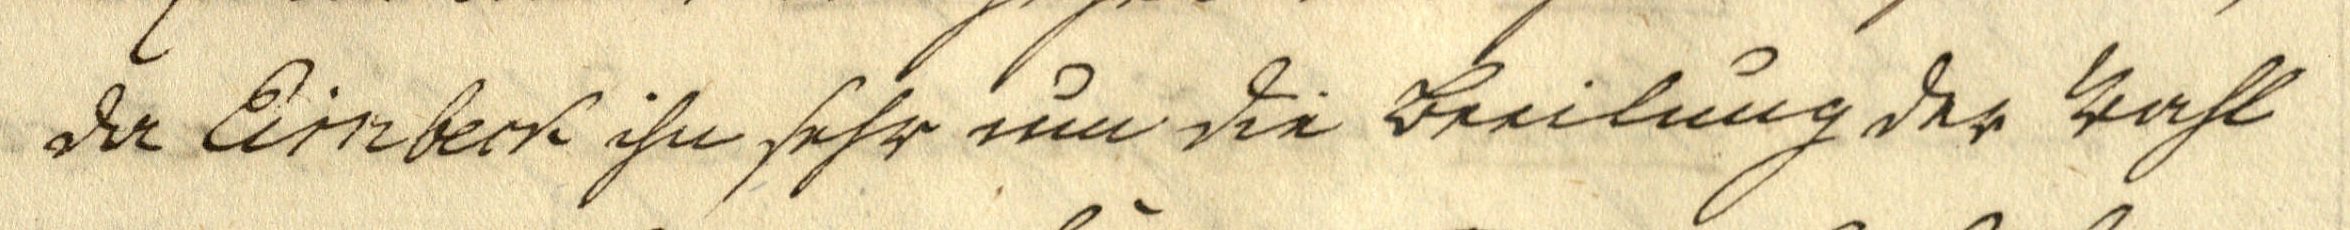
da Eimbeck ihn sehr um die Beeilung der Wahl
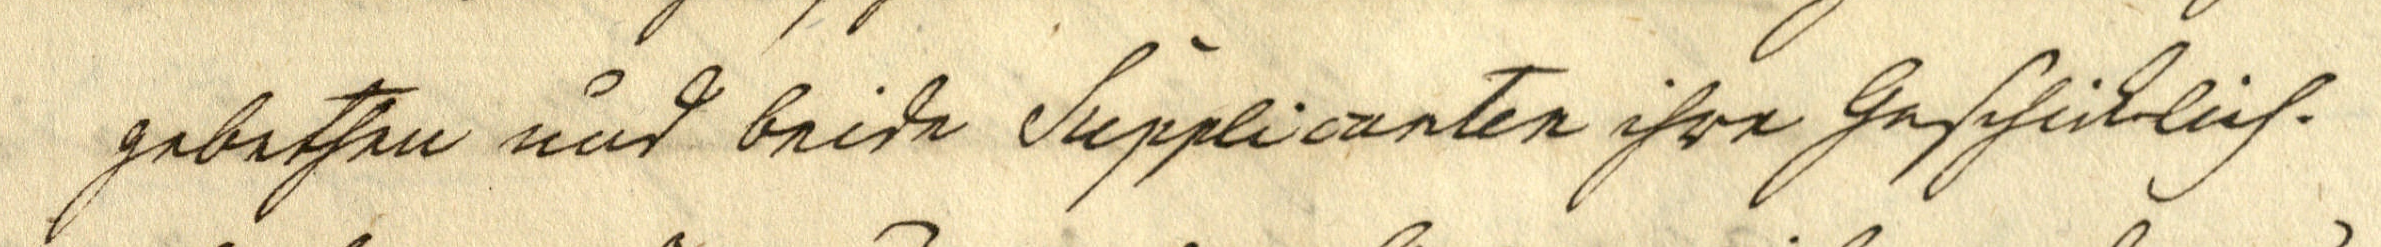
gebethen und beide Supplicanten ihre Geschicklich-
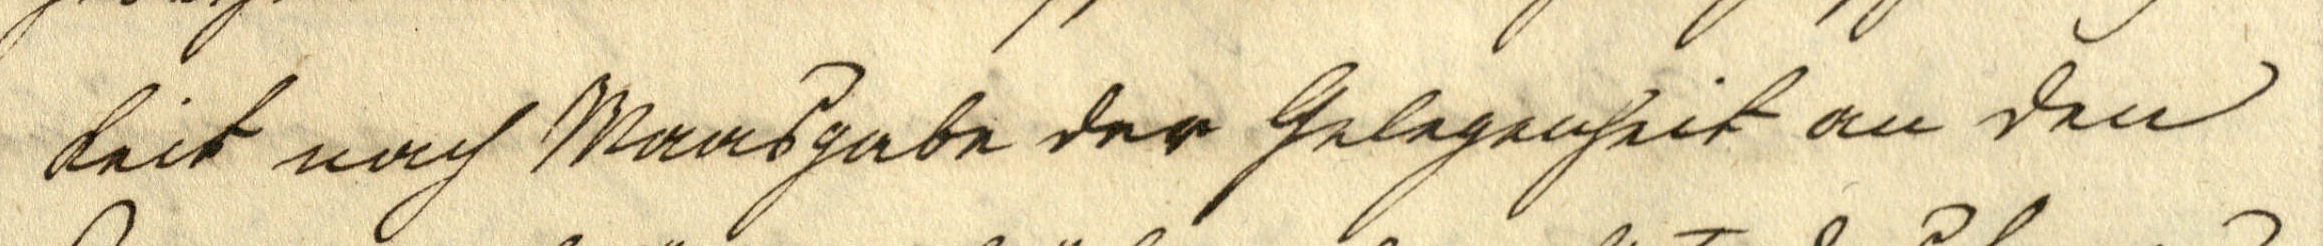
keit nach Maasgabe der Gelegenheit an den
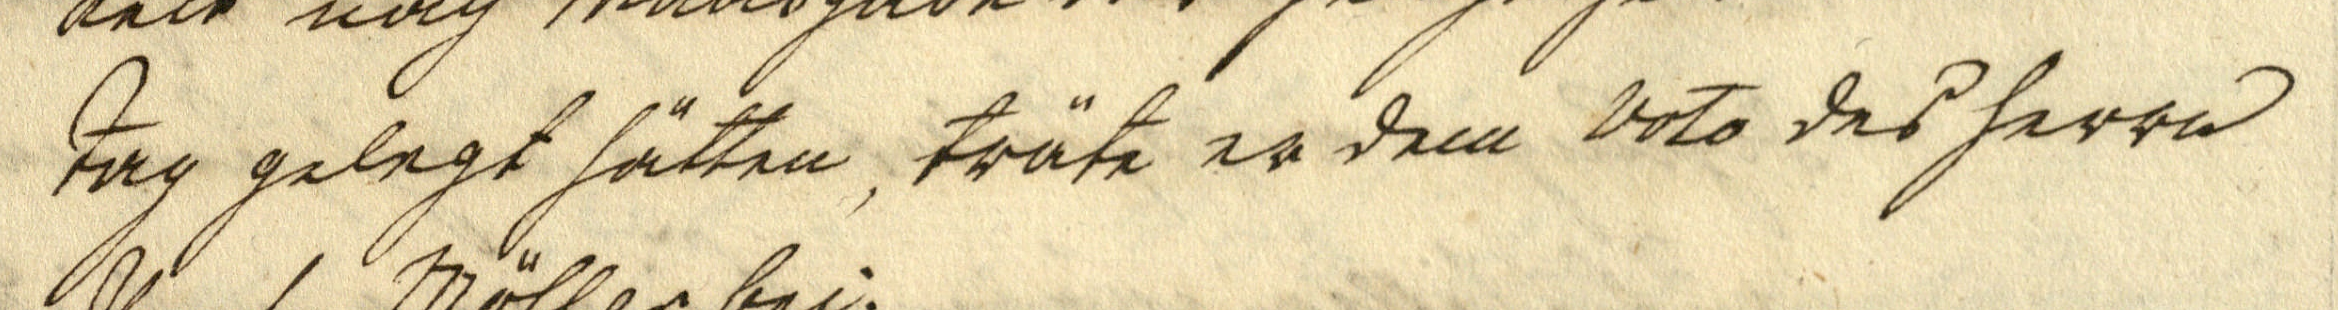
Tag gelegt hätten, träte er dem voto des Herrn
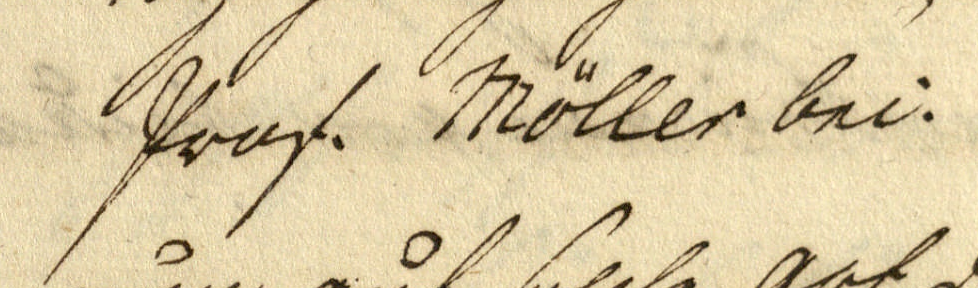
Prof. Möller bei.
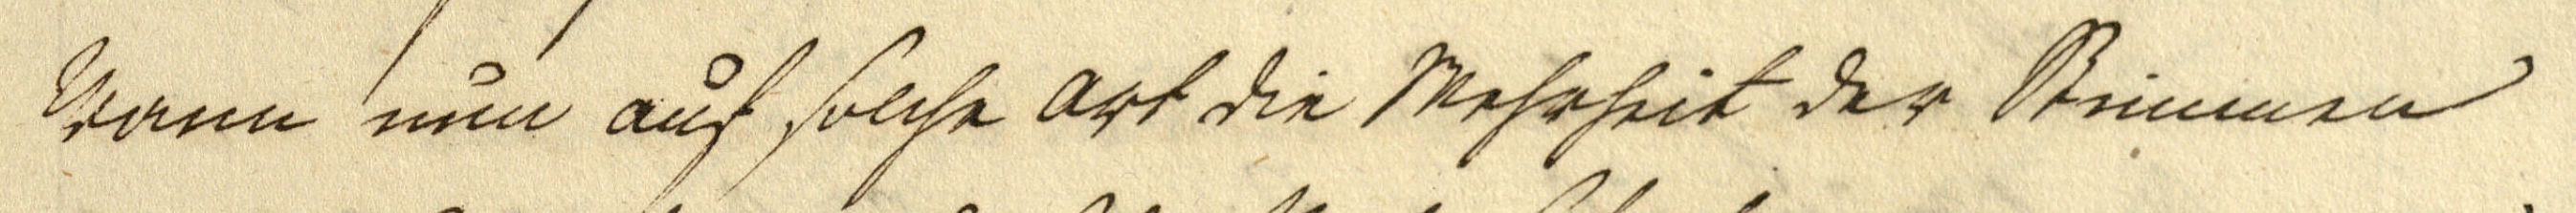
Wann nun auf solche Art die Mehrheit der Stimmen
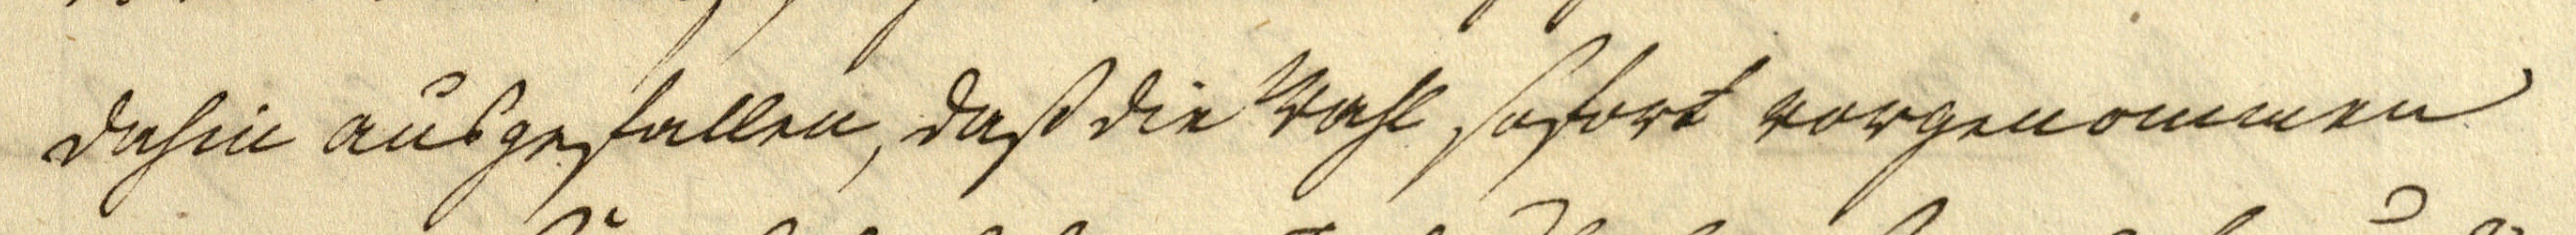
dahin ausgefallen, daß die Wahl sofort vorgenommen
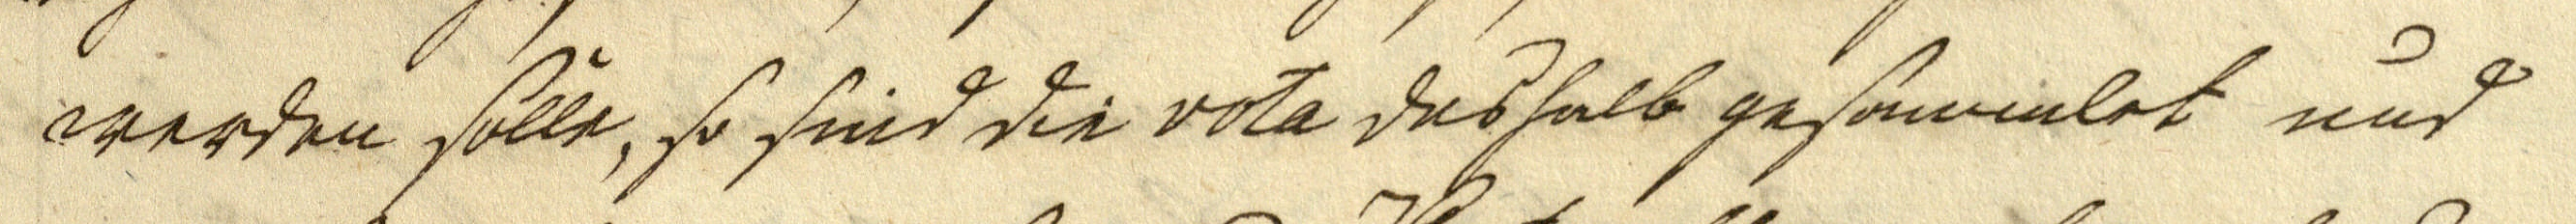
werden solle, so sind die vota deshalb gesammlet und
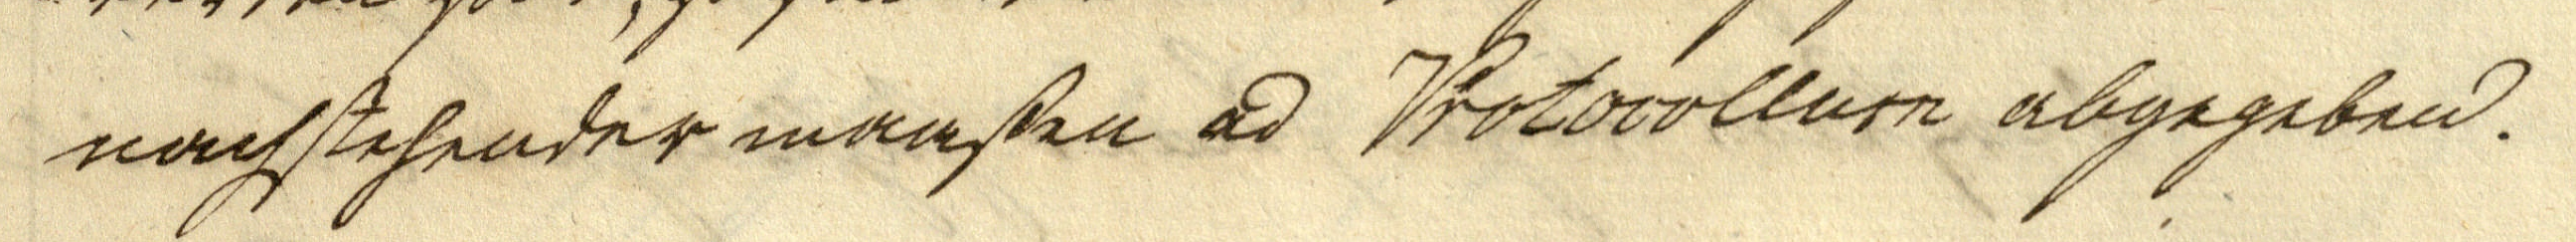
nachstehender maaßen ad protocollum abgegeben.
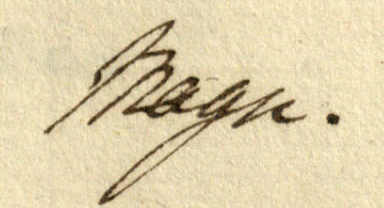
Magn.
